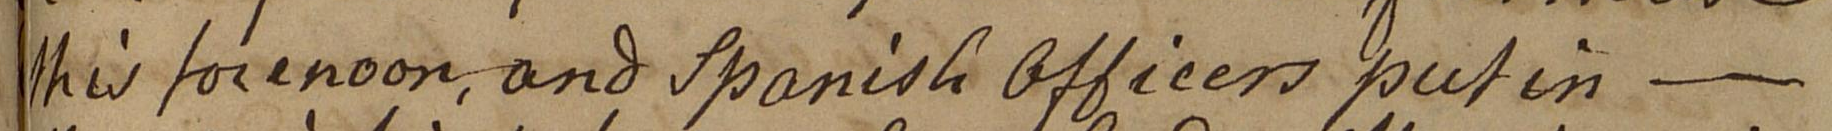this forenoon, and Spanish Officers put in-
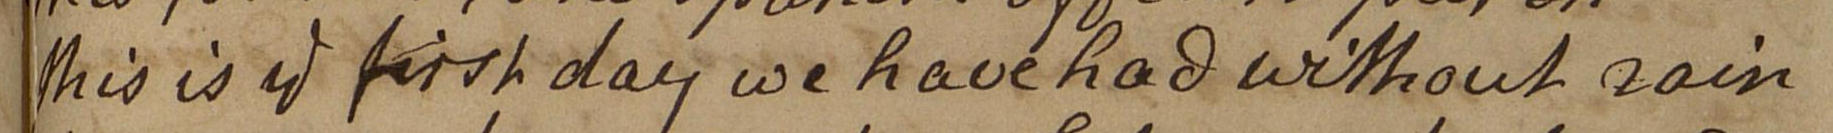this is y^e first day we have had without rain
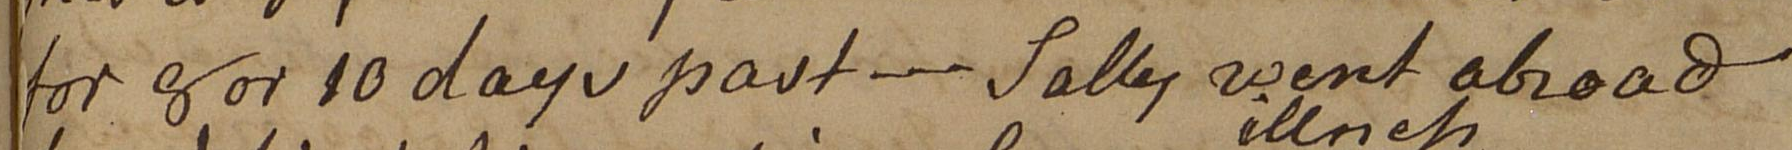for 8 or 10 days past- Sally went abroad
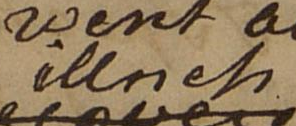illness
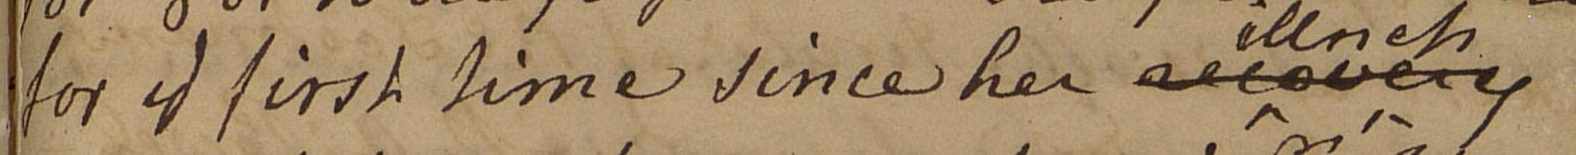for y^e first time since her [recovery]
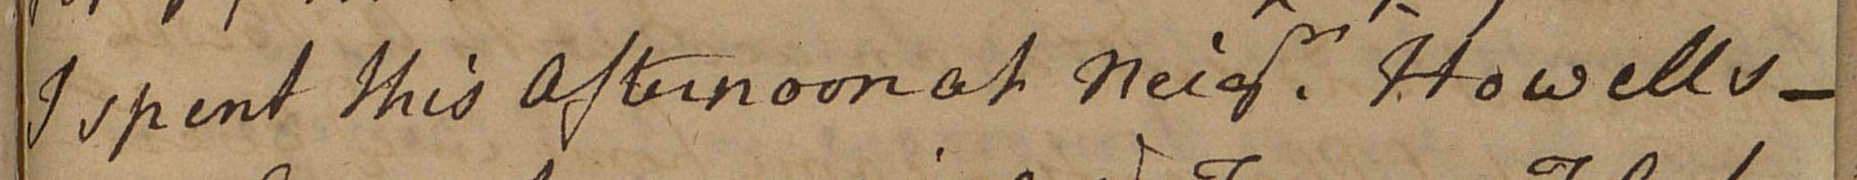I spent this afternoon at Neig.^r Howells-
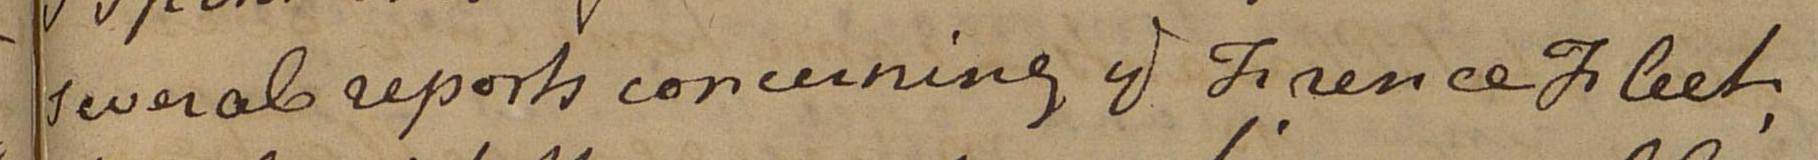several reports concerning y^e Frence Fleet,
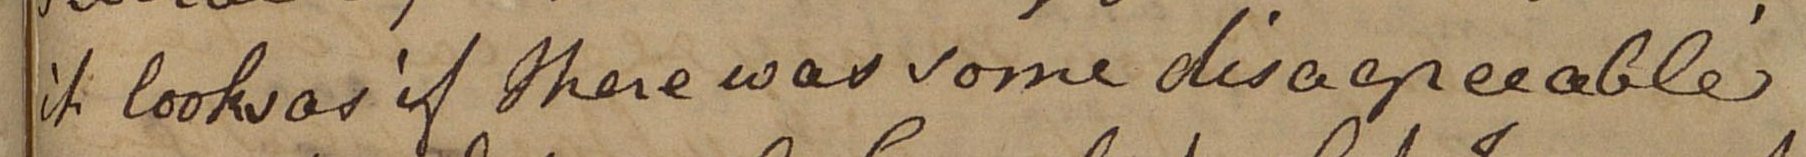if looks as if there was some disagreeable
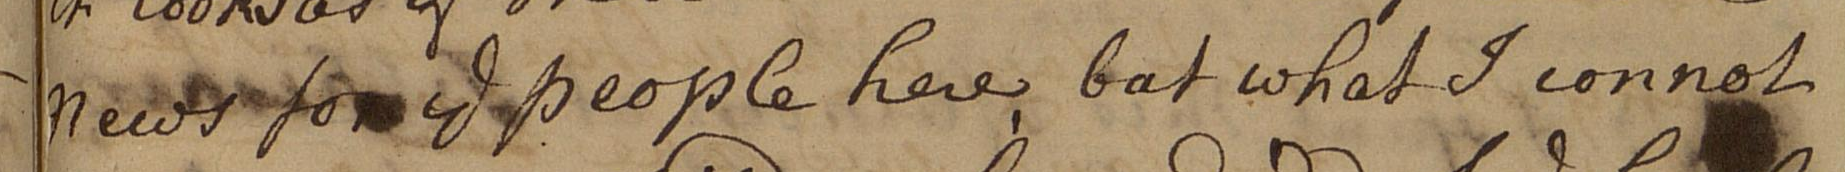news for y^e people here but what I connot
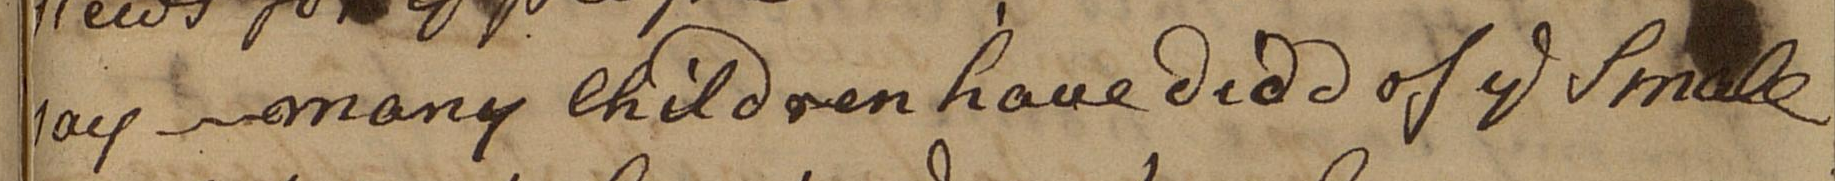say- many children have didd of y^e Small
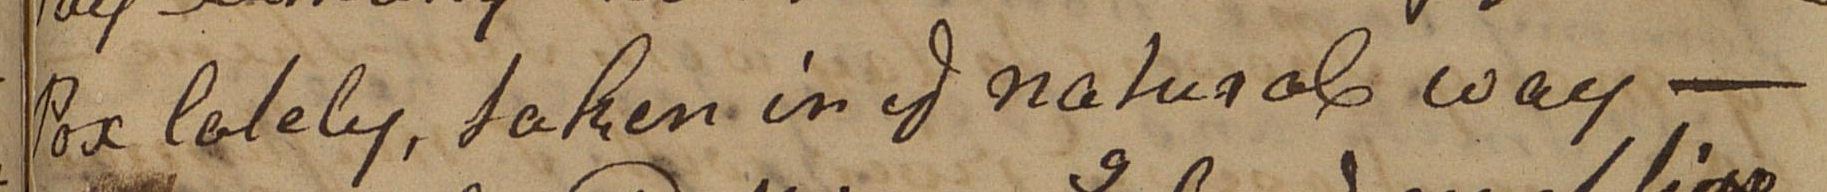Pox lately, taken in y^e natural way-
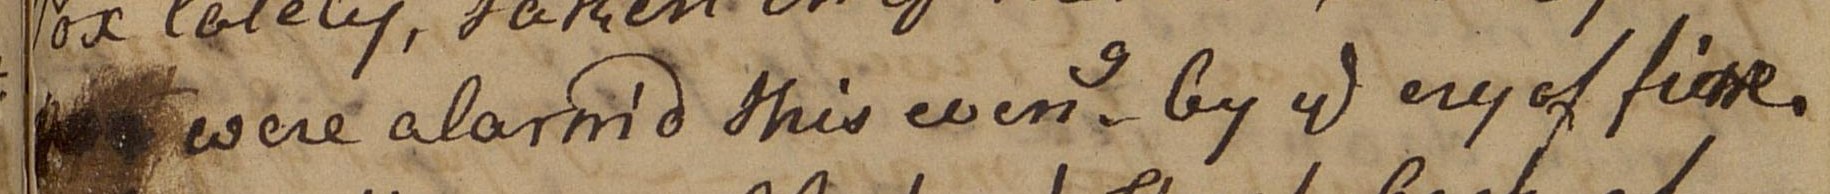[__] were alarm'd this even^g- by y^e [ery] of [fire].
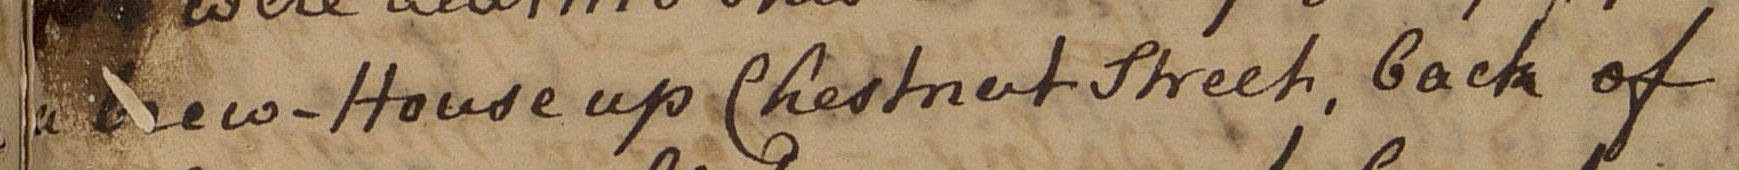a [b]rew-House up Chestnut Street, back of
